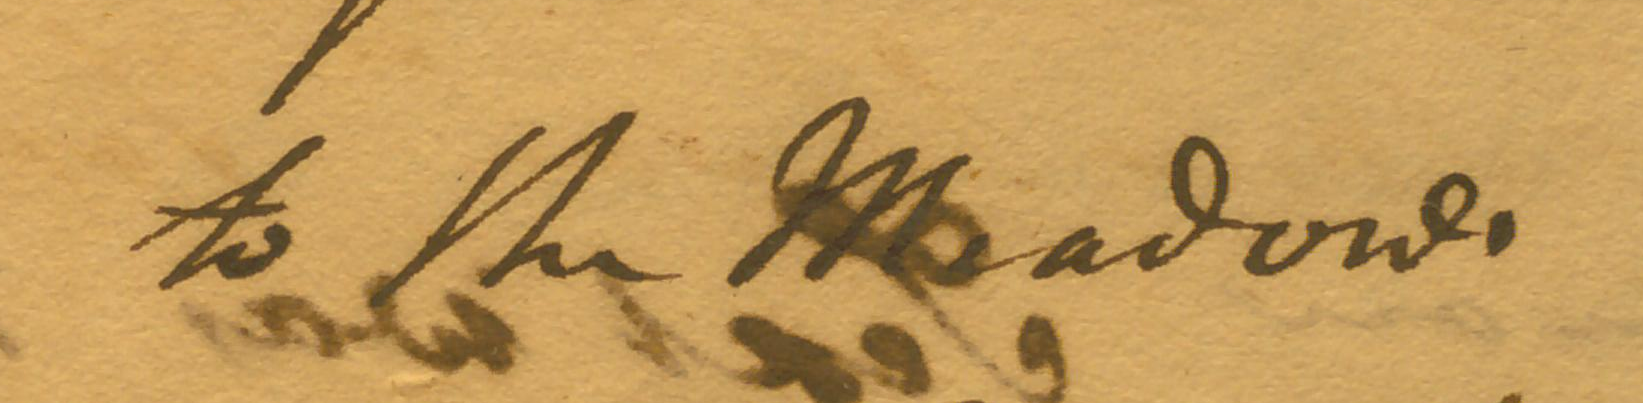to the Meadows
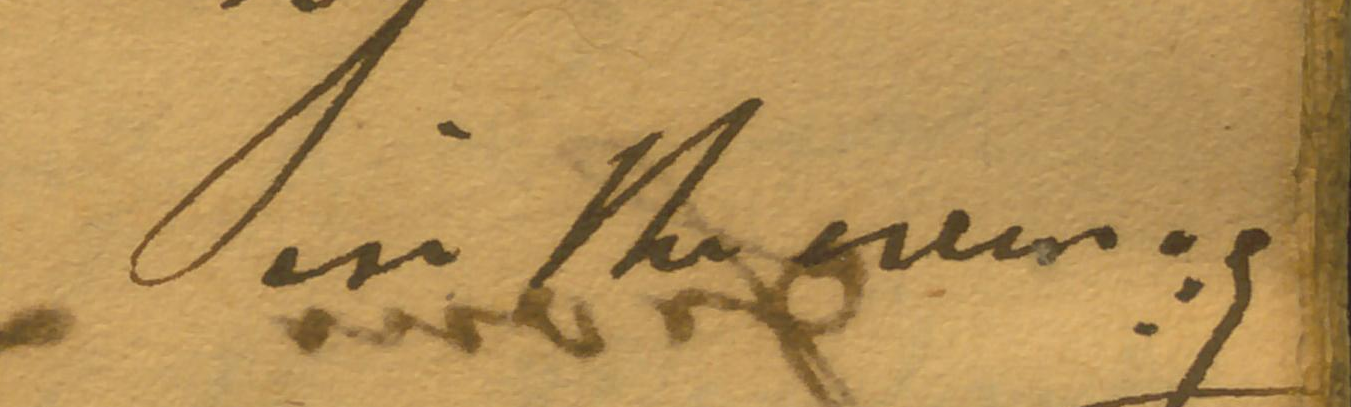in the eveng:
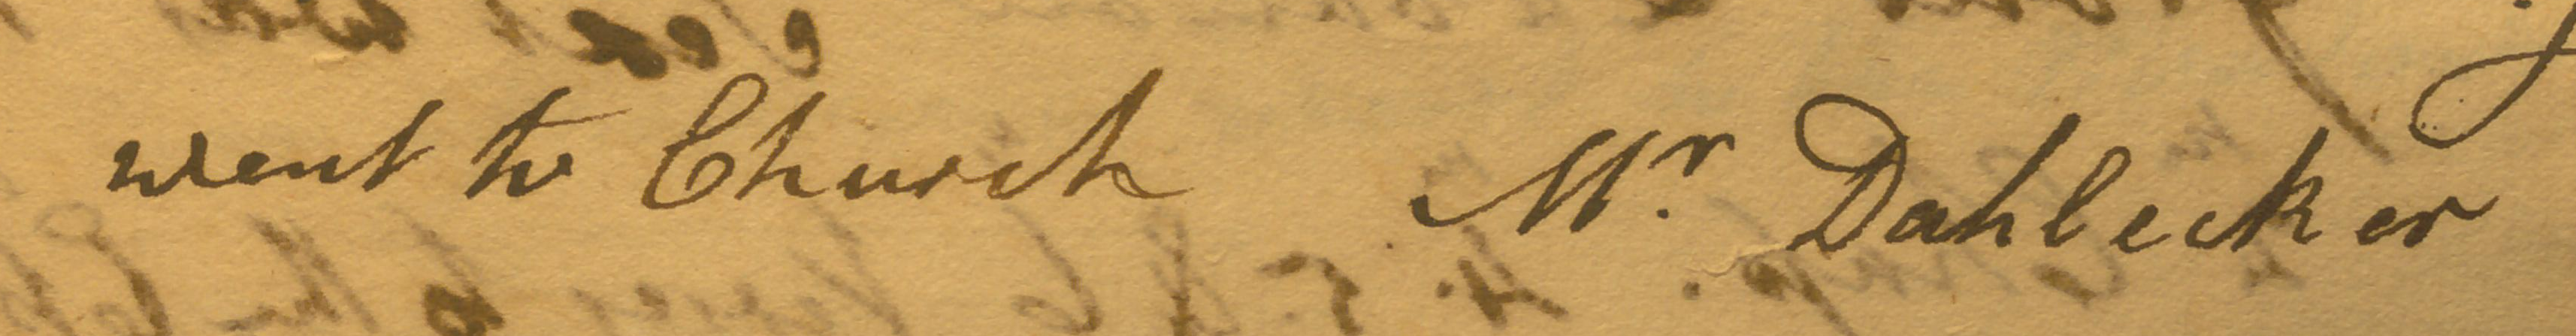went to Church M^r. Dahlecker
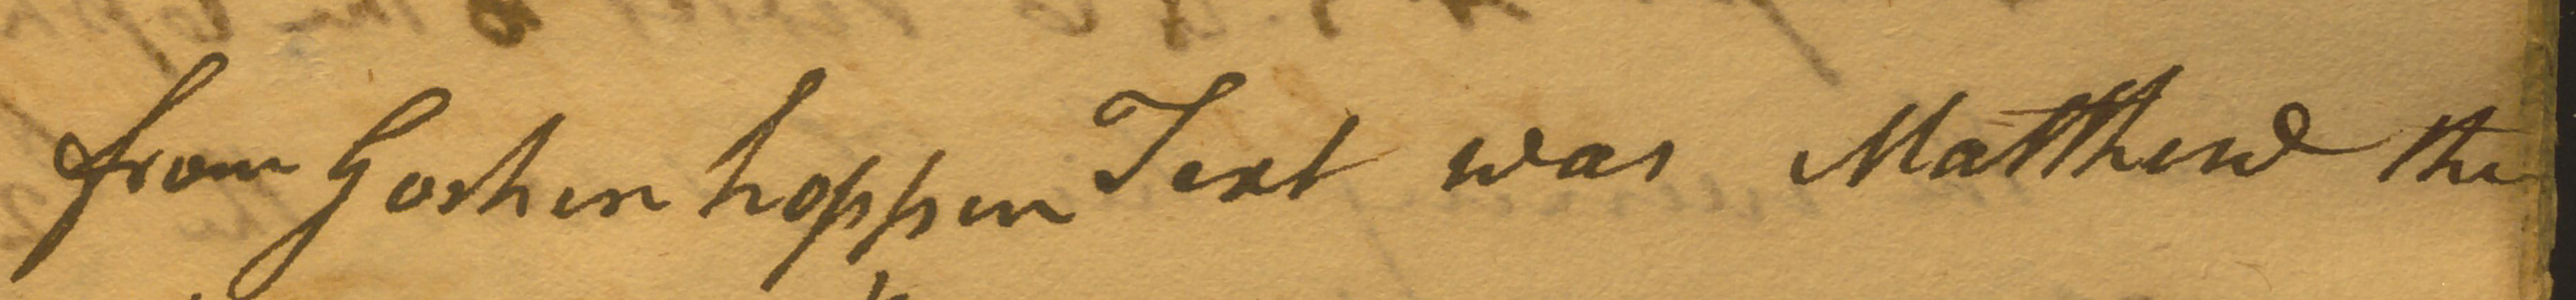from Goshenhoppen Text was Matthew the
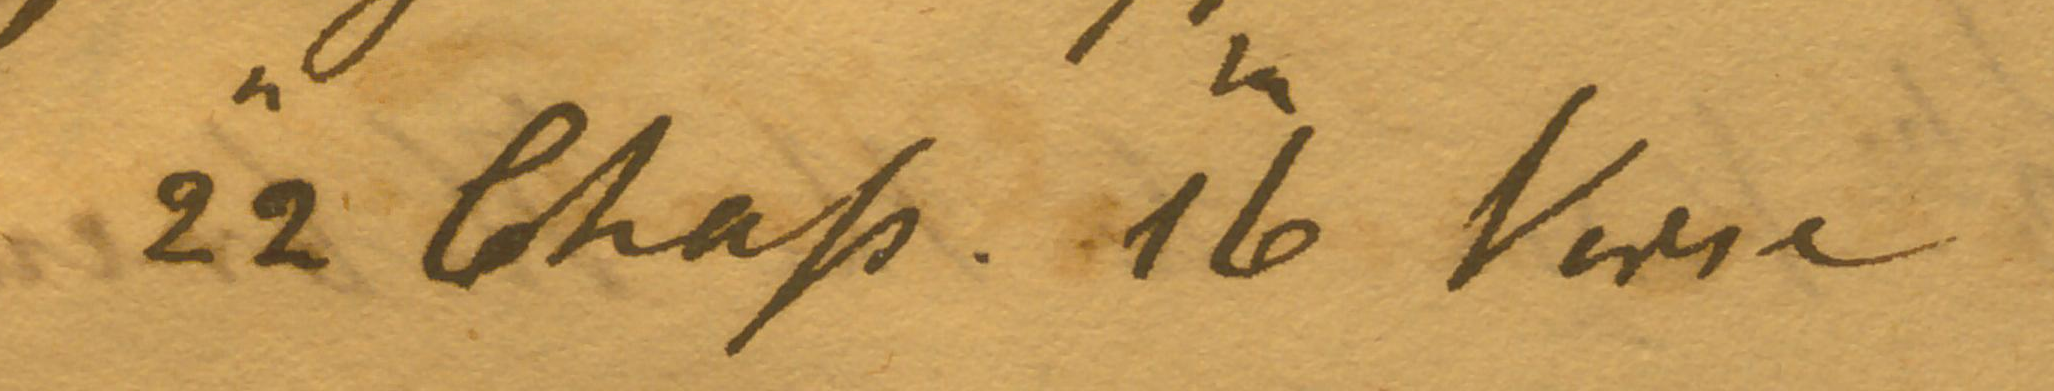22^h Chap. 16^th Verse
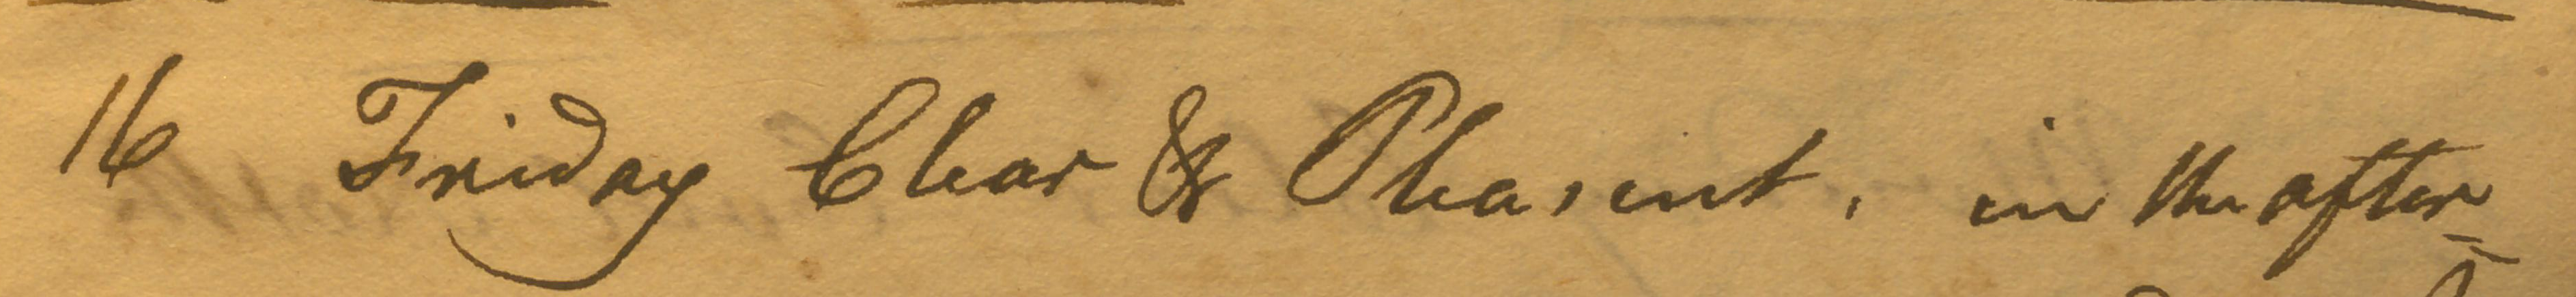16 Friday Clear & Pleasent, in the after
